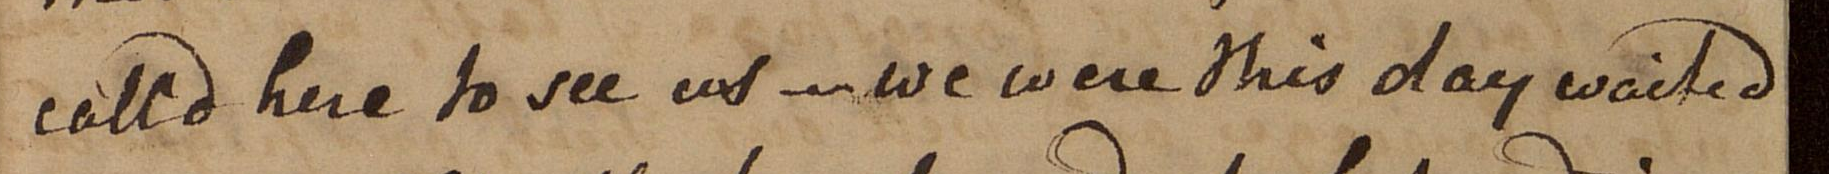call'd here to see us- we were this day waited
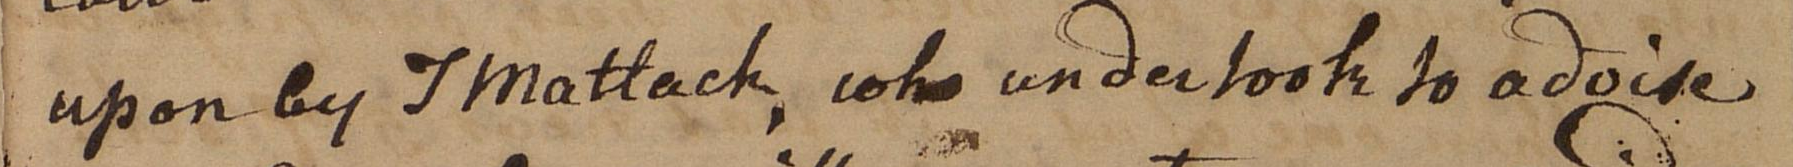upon by T Matlack, who undertook to advise
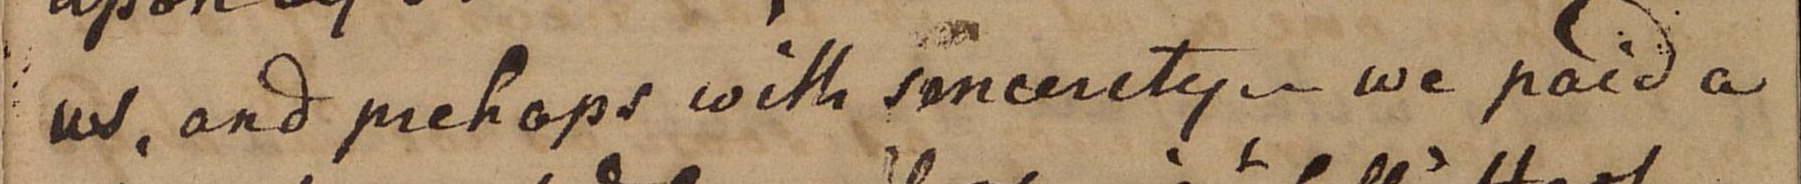us, and prehaps with sincerity- we paid a
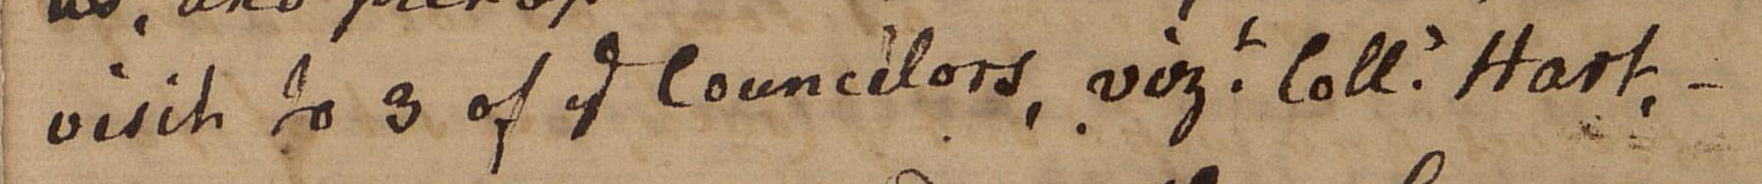visit to 3 of y^e Councilors, viz^t. Coll^l. Hart.-
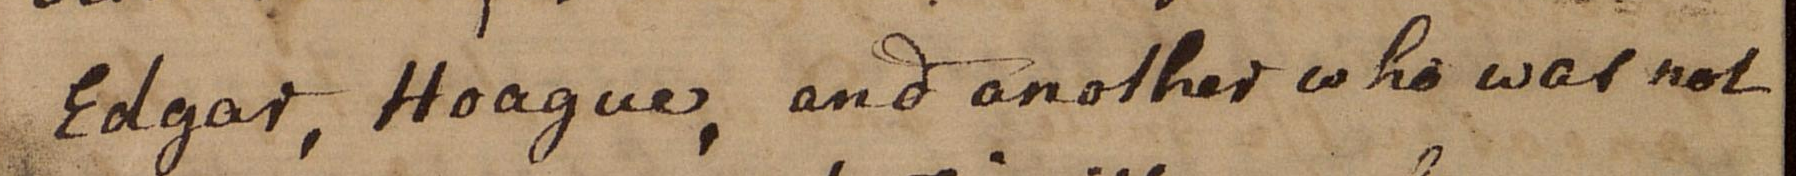Edgar, Hoague, and another who was not
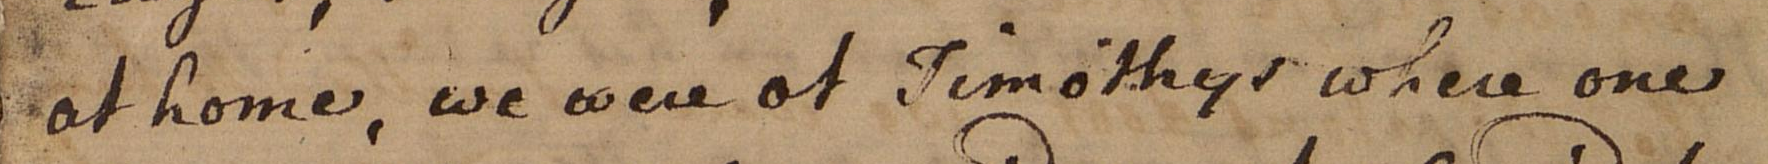at home, we were at Timothys where one
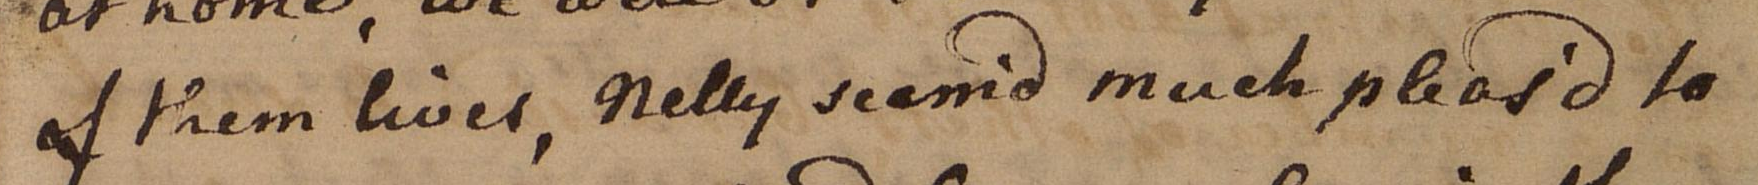of them lives, Nelly seam'd much pleas'd to
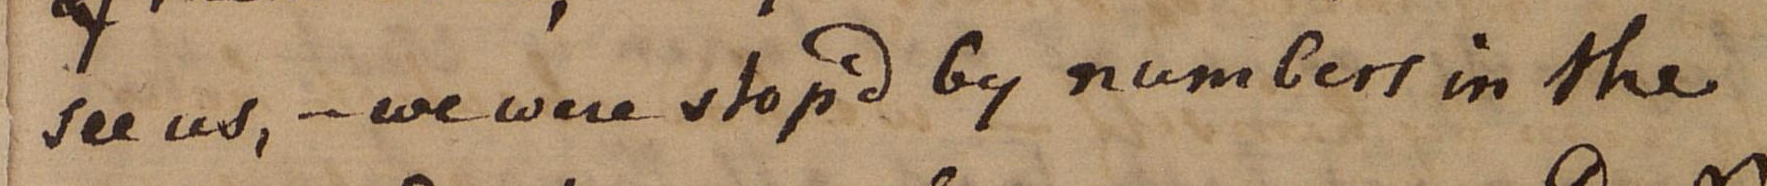see us,- we were stop'd by numbers in the
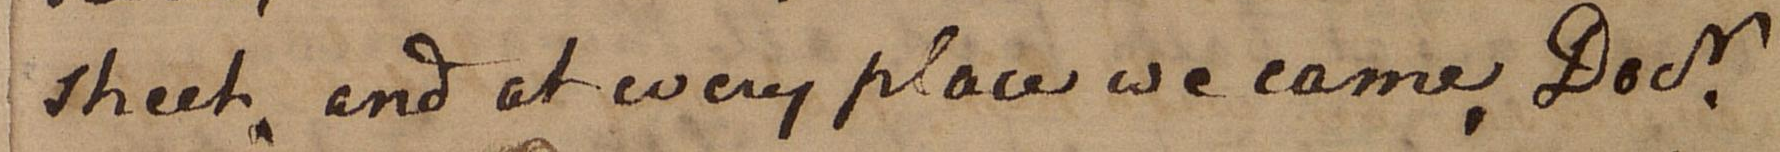street, and at every place we came Doc^r.
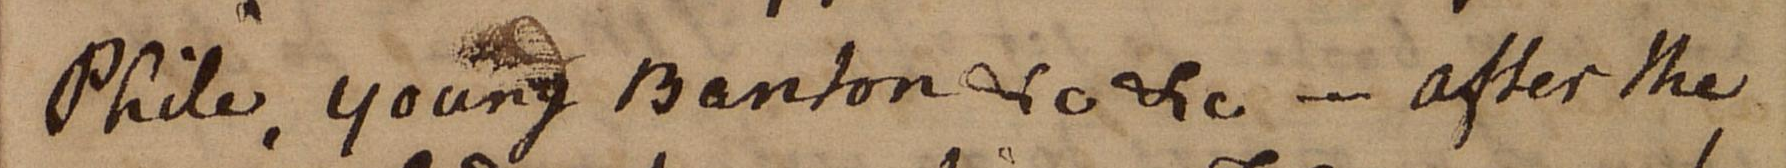Phile, young Banton &c &c- after the
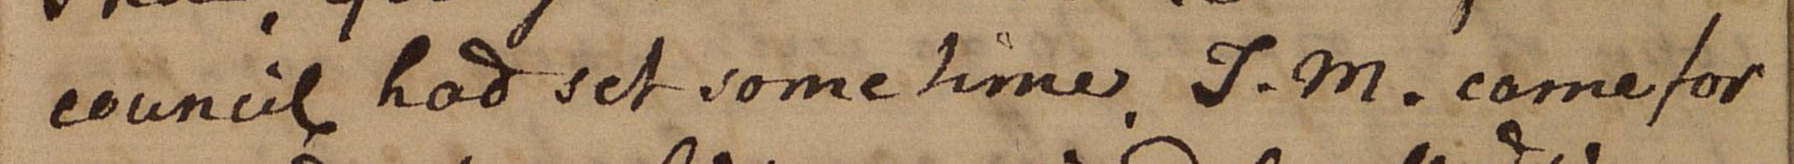council had set some time, T. M. came for
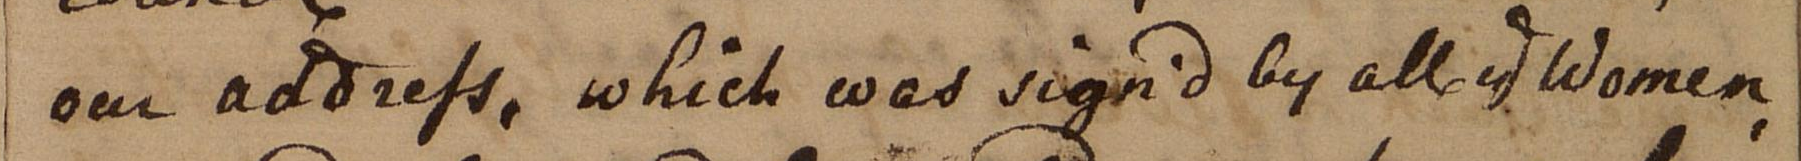our address, which was sign'd by all y^e women,
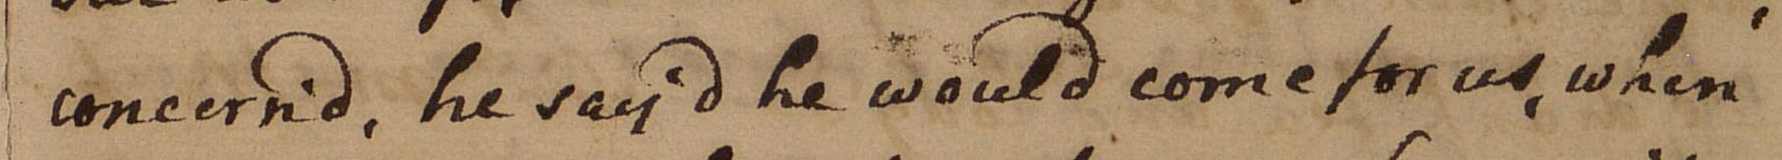concern'd, he say'd he would come for us, when
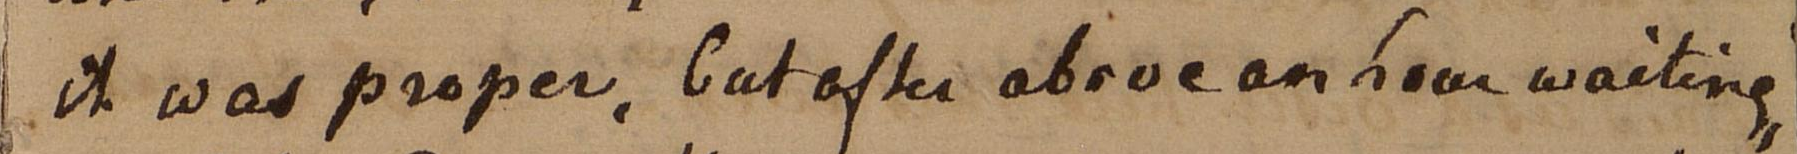it was proper, but after above an hour waiting,
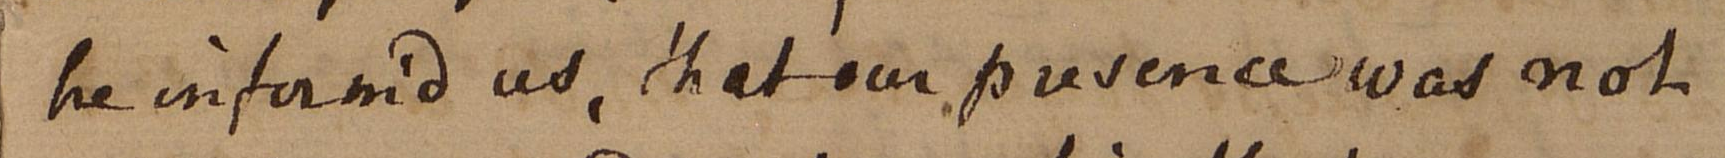he inform'd us, that our presence was not
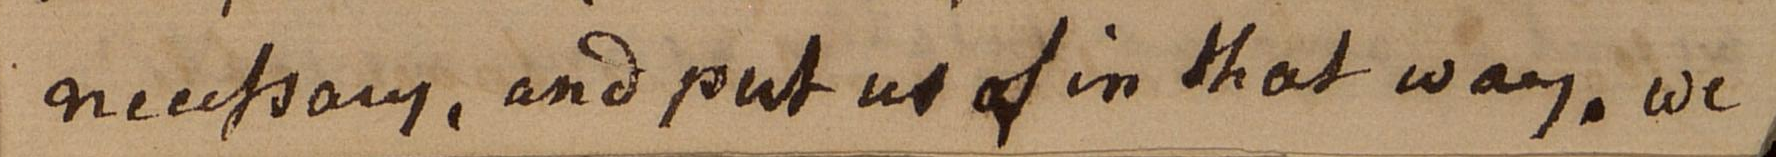necessary, and put us of in that way, we
